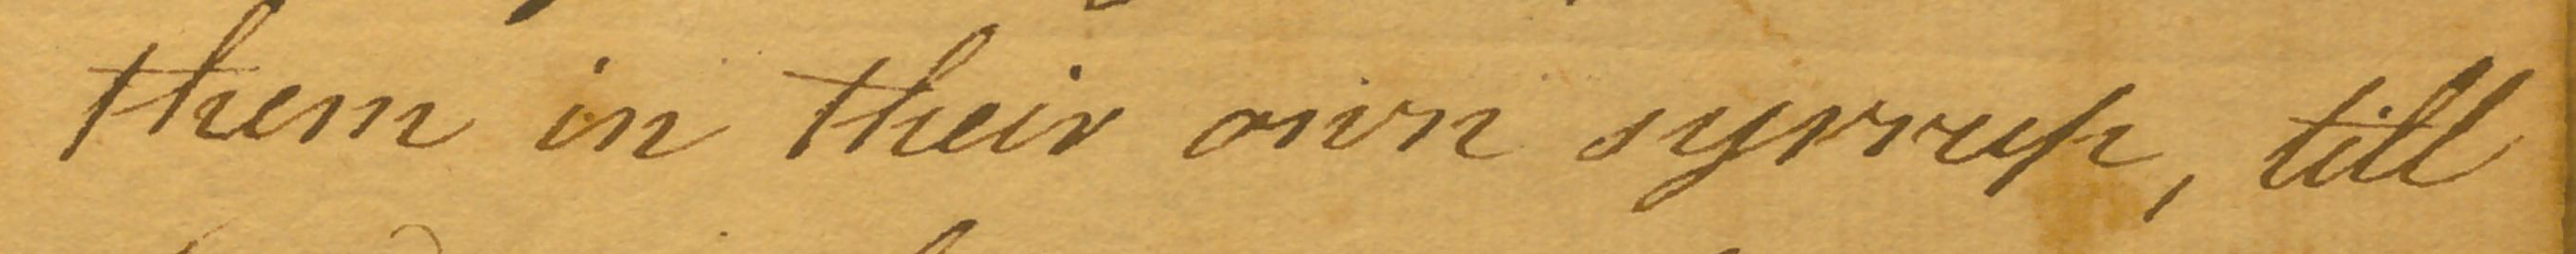them in their own syrrup, till
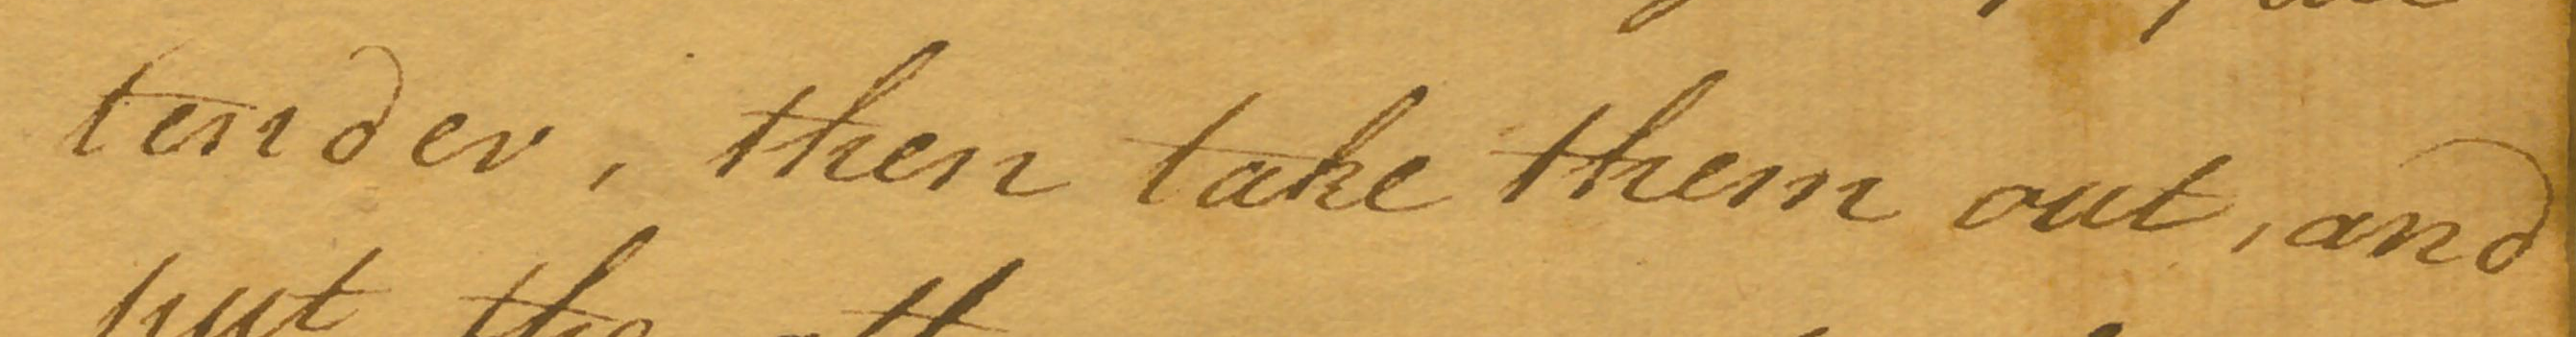tender, then take them out, and
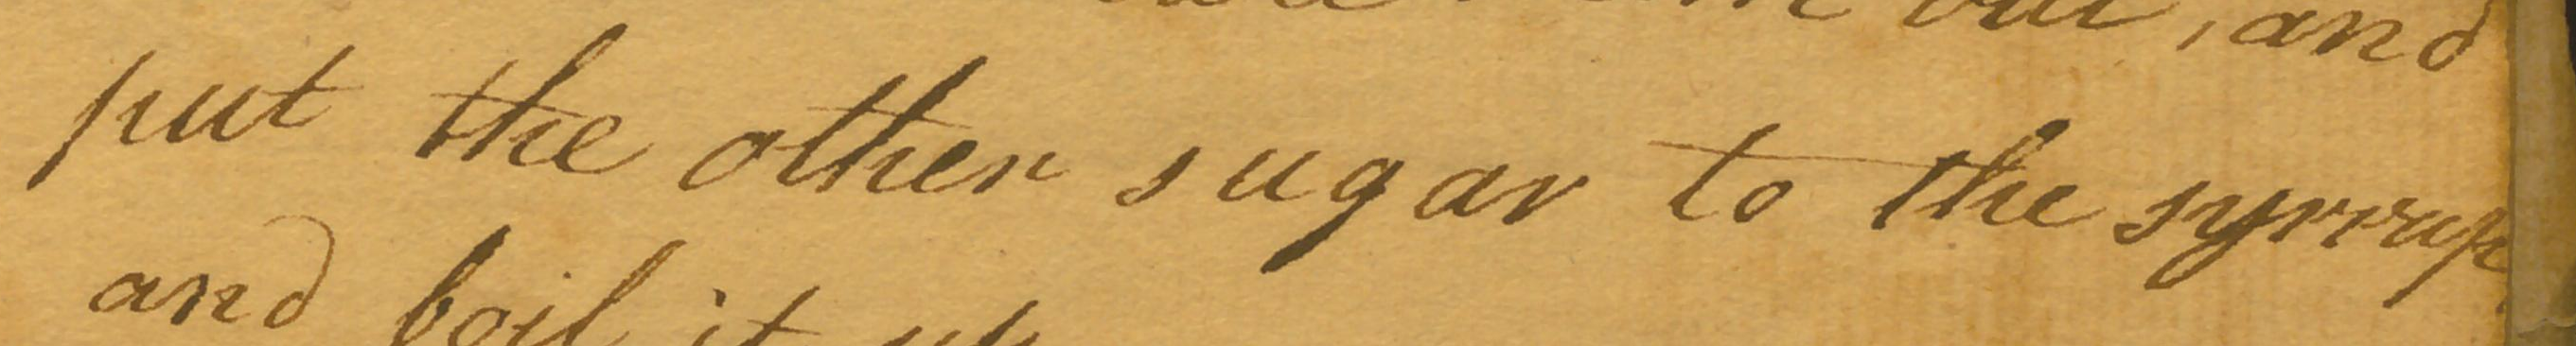put the other sugar to the syrrup
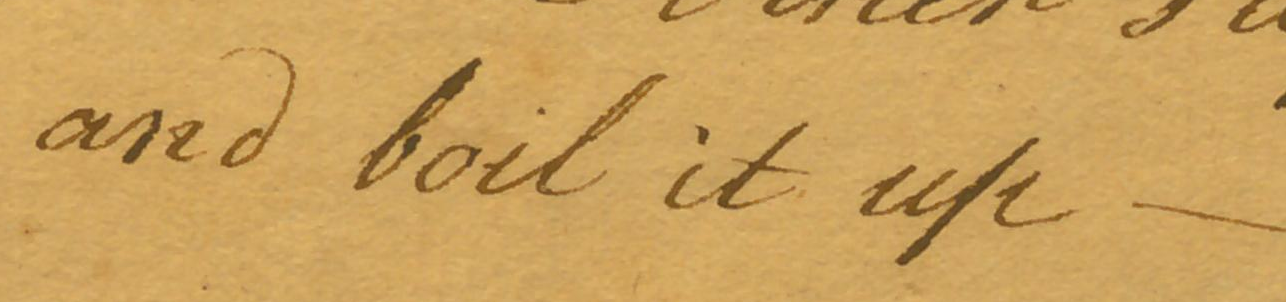and boil it up-
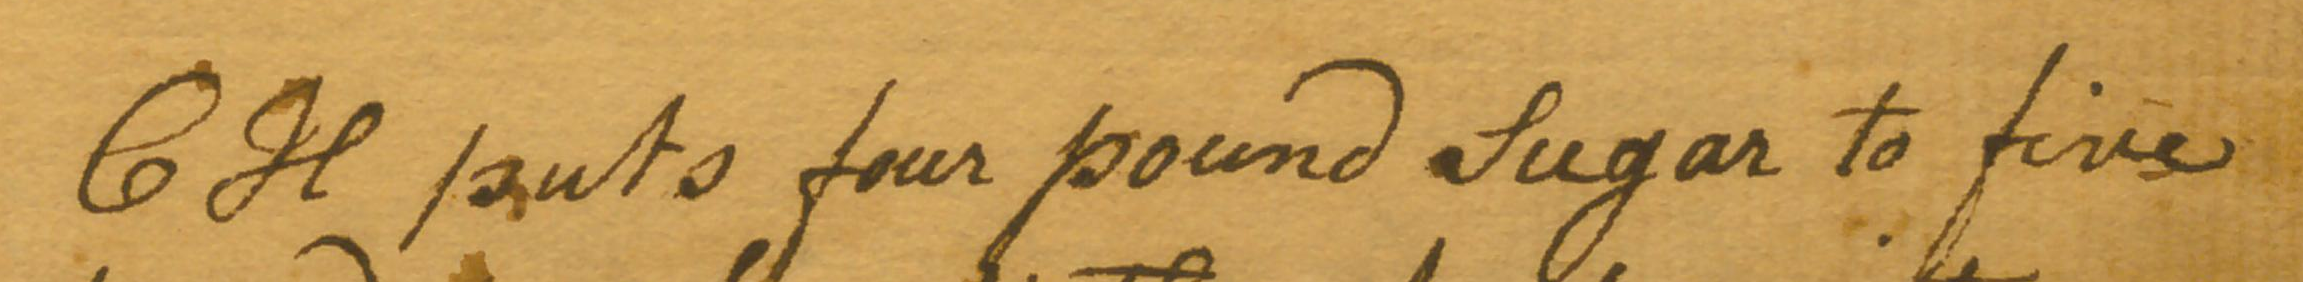CH puts four pound sugar to five
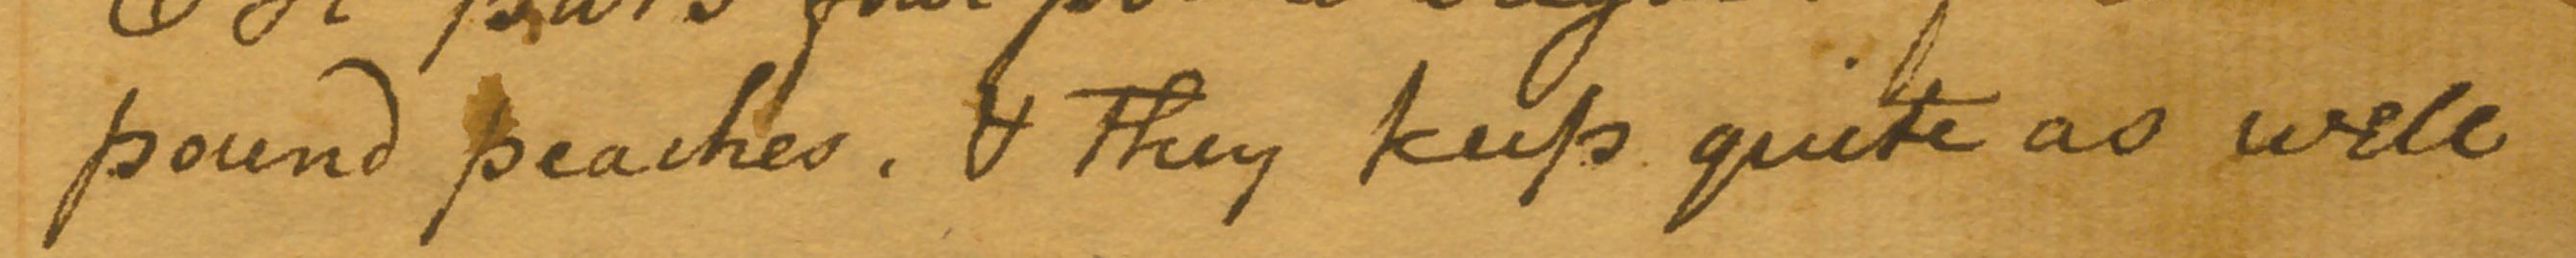pound peaches & they keep quite as well
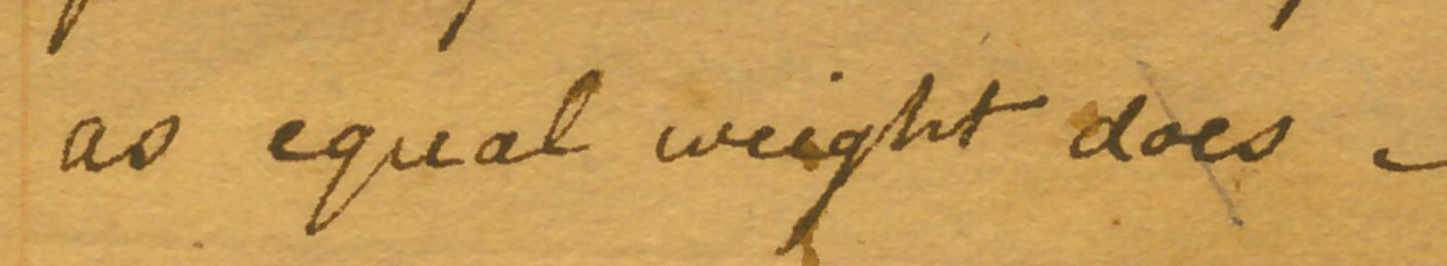as equal weight does-
